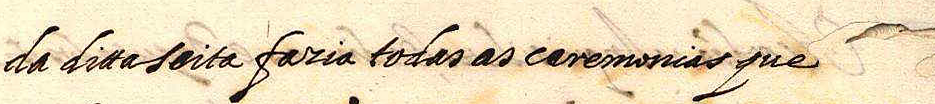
da ditta seita fazia todas as ceremonias que
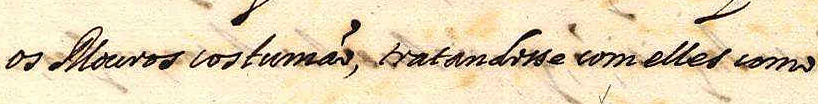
os Mouros costumaõ, tratandosse com elles como
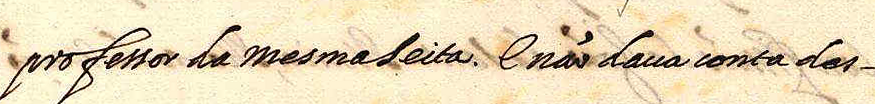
professor da mesma seita. E naõ daua conta des
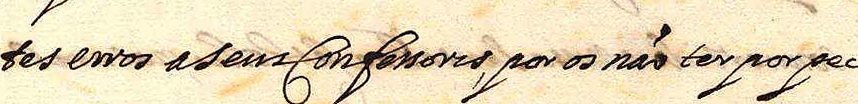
tes erros a seus Confessores, por os naõ ter por pec
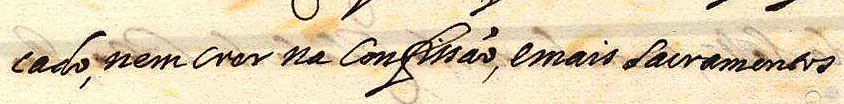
cado, nem crer na confissaõ, e mais sacramentos
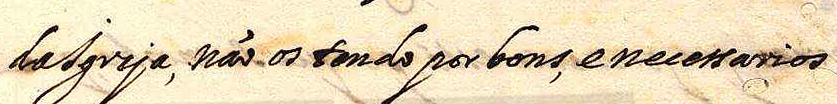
da Jgreja, naõ os tendo por bons, e necessarios
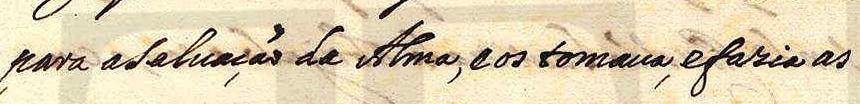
para a saluaçaõ da Alma, e os tomaua, e fazia as
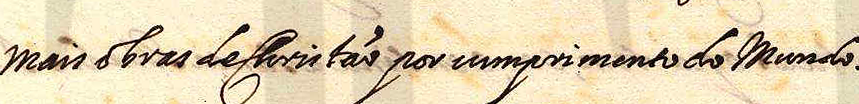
mais obras de Christaõ por cumprimento do Mundo
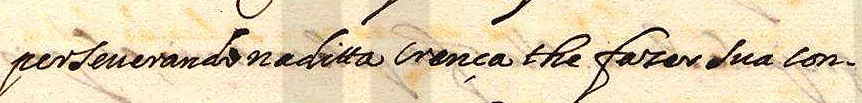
perseuerando na ditta crença the fazer sua con
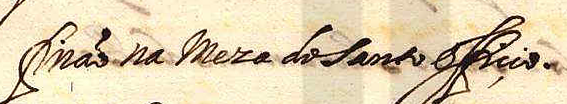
fissaõ na Meza do santo Offiçio.
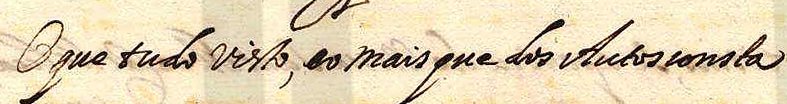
O que tudo visto, e o mais que dos Autos consta
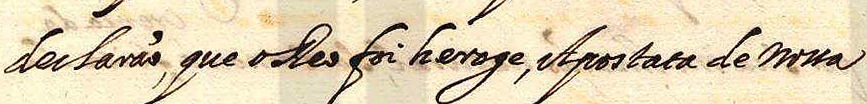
decLaraõ, que o Reo foi herege, Apostata de nossa
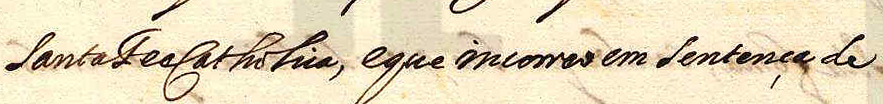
santa Fee CathoLica, e que incorreo em sentença de
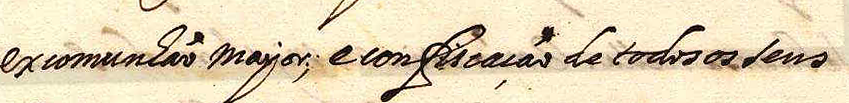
excomunhaõ mayor; e confiscaçaõ de todos os seus
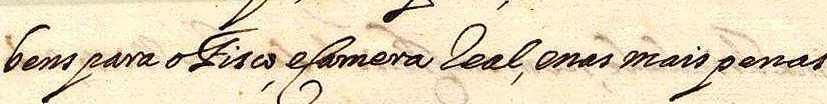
bens para o Fisco, e Camera Real, e nas mais penas
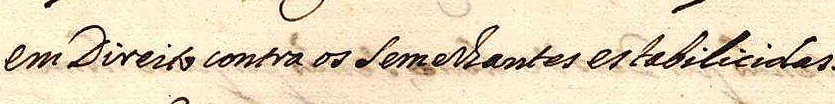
em Direito contra os semelhantes estabilicidas.
